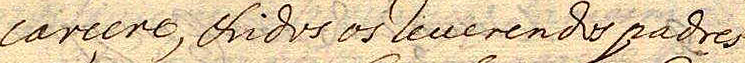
carçere, & idos os Reuerendos padres
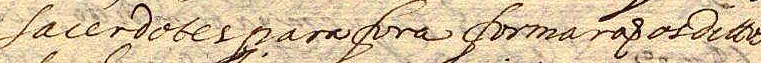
Sacerdotes para fora formaraõ os dittos
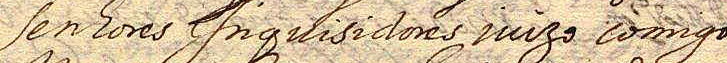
Senhores Jnquisidores iuizo comigo
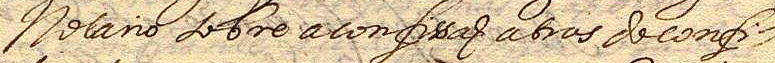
Notario sobre a confissaõ atras do confi
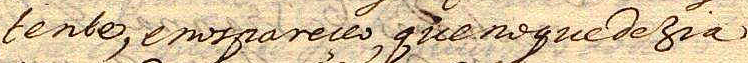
tente, e nos pareçeo, que no que dezia
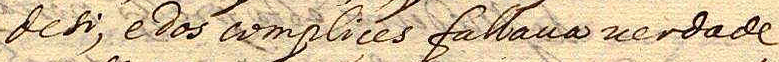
de si, e dos complices fallaua uerdade,
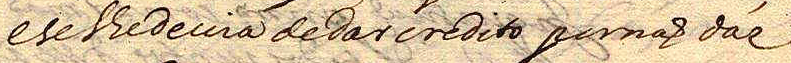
e se lhe deuia de dar credito per naõ dar
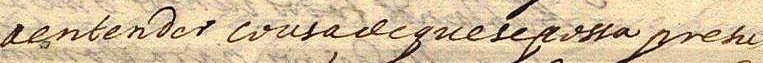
a entender cousa de que se possa presu
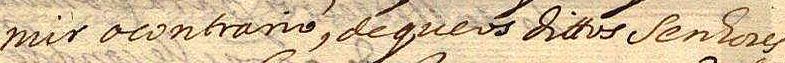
mir o contrario, de que os dittos Senhores
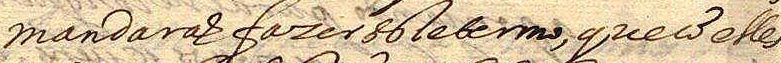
mandaraõ fazer este termo, que cō elles
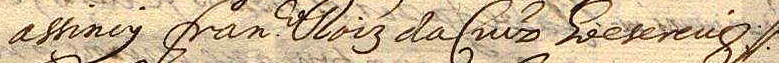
assiney fran.co Roiz̄ da Crūz ho escreuj ://:
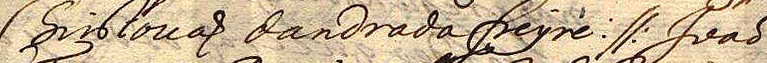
Christouaõ dandrada freyre ://: Joaõ
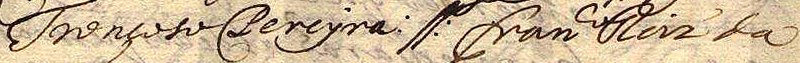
Troncoso Pereyra ://: franco Roiz̄ da
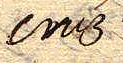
cruz̄
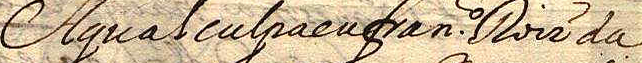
A qual culpa eu fran.co Roiz̄ da
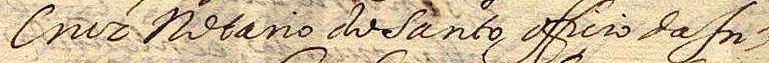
Cruz̄ notario do Santo officio da Jn
